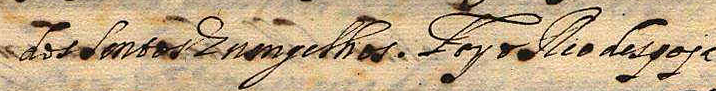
dos Santos Euangelhos. Foy o Reo despoja
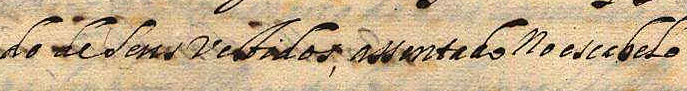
do de Seus vestidos, assentado no escabelo
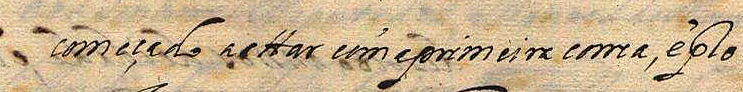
começado a attar com̄ a primeira correa, e pro
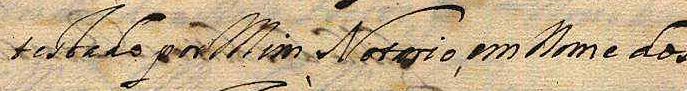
testado por Mim Notario, em Nome dos
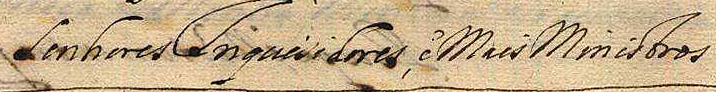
Senhores Inquisidores, e Mais Ministros
